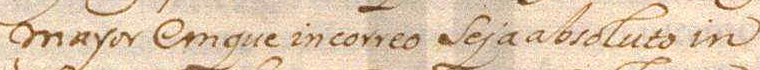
mayor em que incorreo seja absoluto in
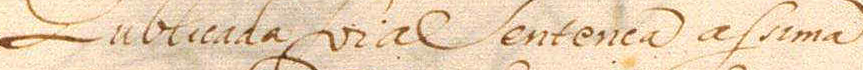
Publicada foi a Sentenca assima
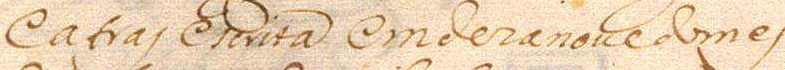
e atras escrita em dezanoue do mes
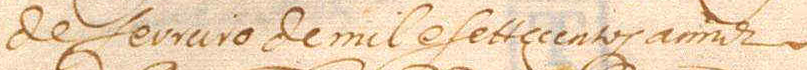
de fevreiro de mil e settecentos annoz
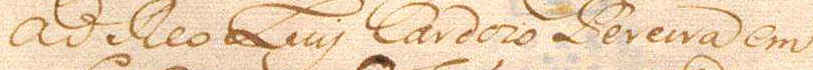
ao Reo Luis Cardozo Pereira em
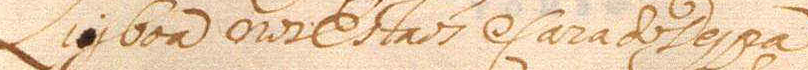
Lisboa nos Estaós e Caza do Despa
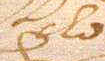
cho
